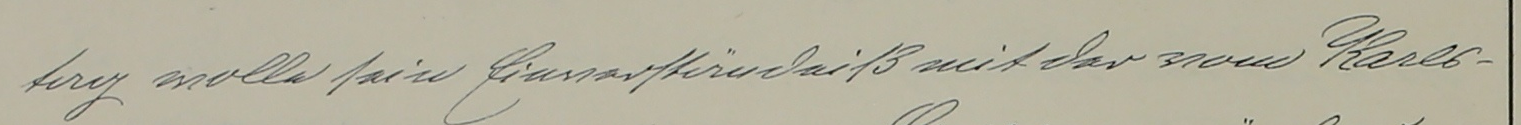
tag wolle sein Einverständniß mit der vom Karls-
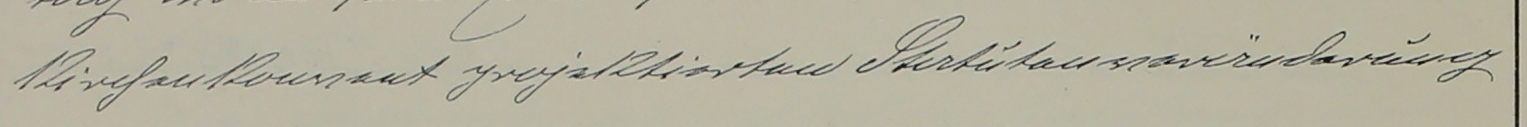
kirchenkonvent projektierten Statutenveränderung
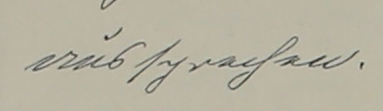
aussprechen.
